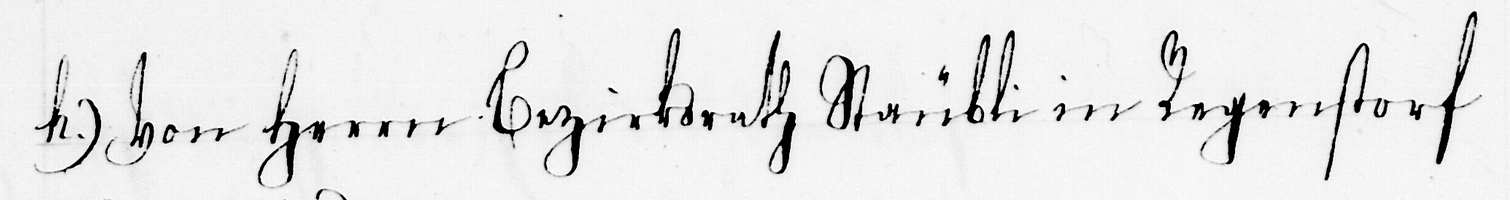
h.) Von Herrn Bezirksrath Stäubli in Regenstorf
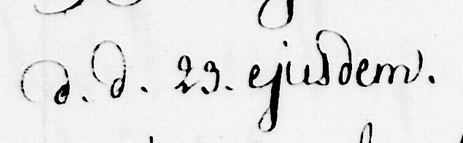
d. d. 23. ejusdem.
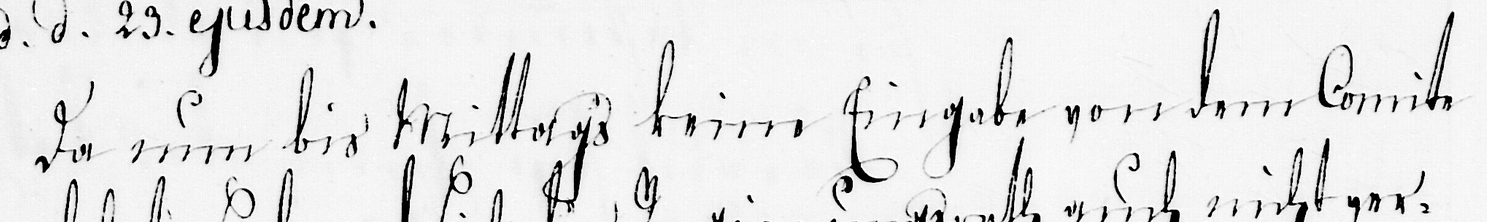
Da nun bis Mittags keine Eingabe von dem Comite
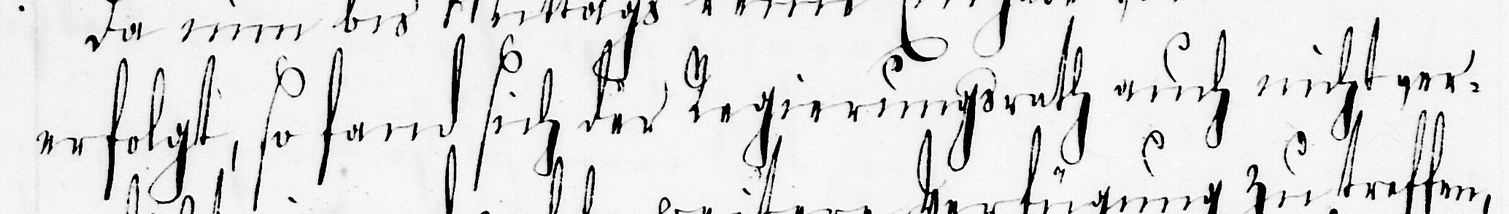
rfolgt, so fand sich der Regierungsrath auch nicht ver¬
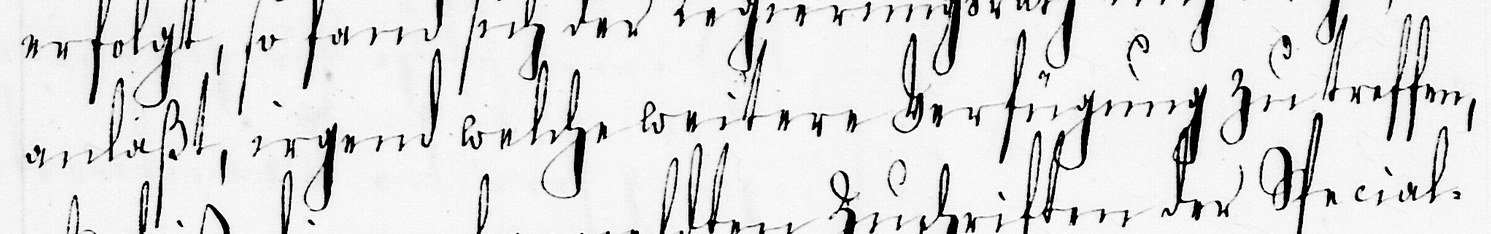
anlaßt, irgend welche weitere Verfügung zu treffen,
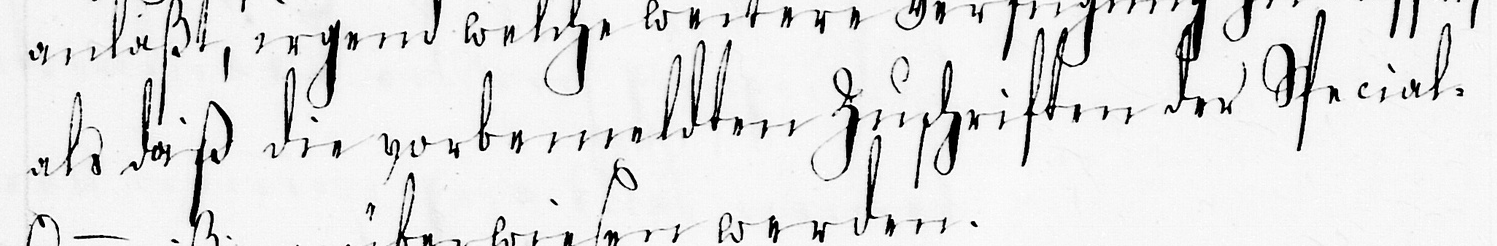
als daß die vorbemeldten Zuschriften der Specia¬
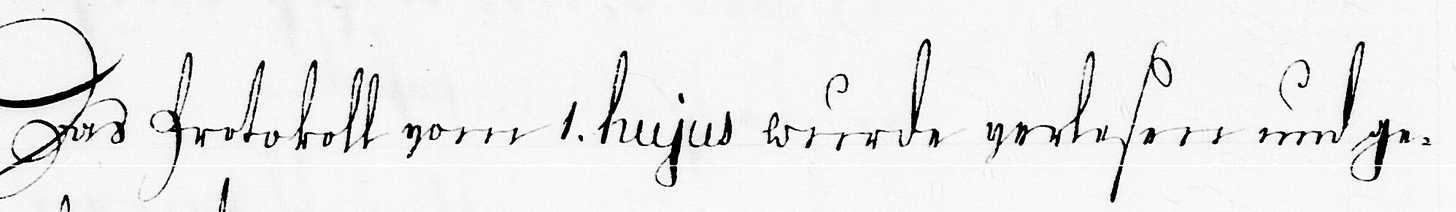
Das Protokoll vom 1. hujus wurde verlesen und ge¬
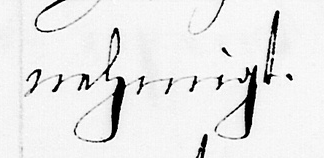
nehmigt.
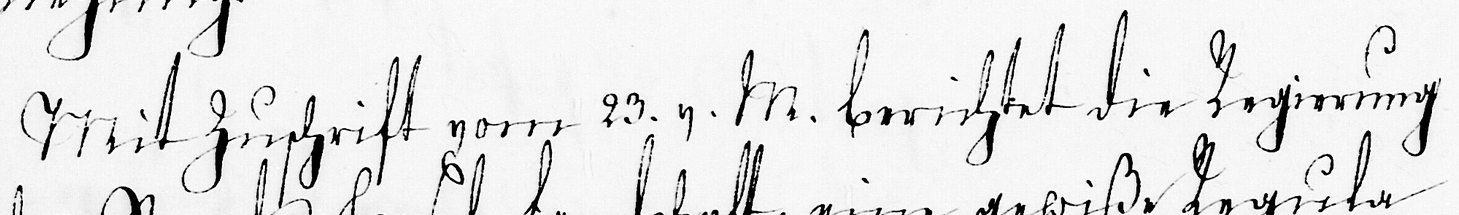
Mit Zuschrift vom 23. v. M. berichtet die Regierung
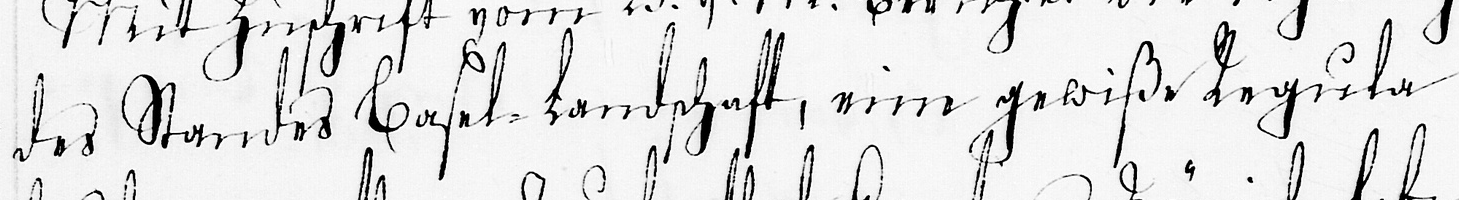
des Standes Basel-Landschaft, eine gewiße Regula
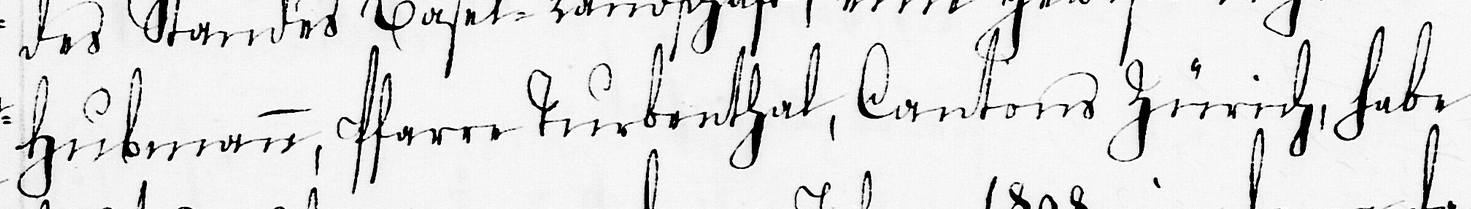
Hubmann, Pfarre Turbenthal, Cantons Zürich, habe
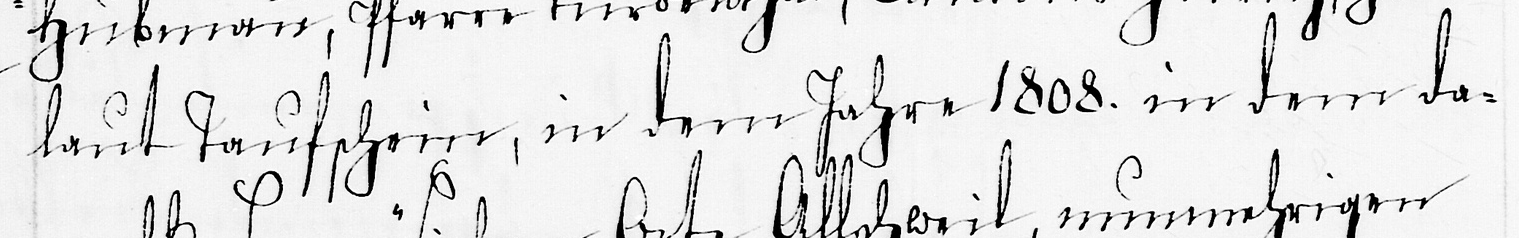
laut Taufschein, in dem Jahre 1808. in dem da¬
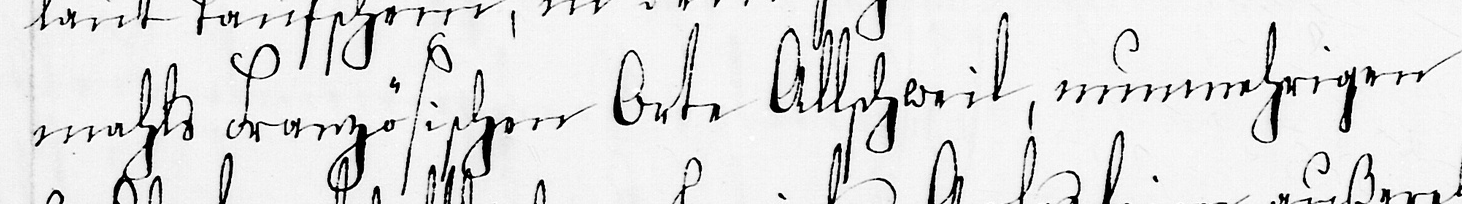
mahls Französischen Orte Allschweil, nunmehrigen
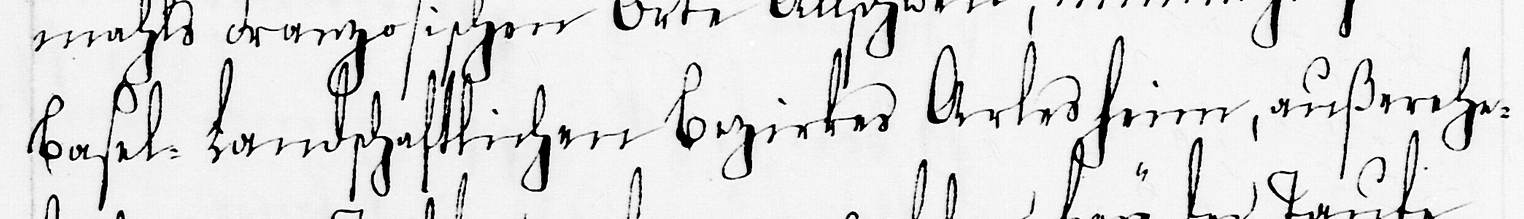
Basel-Landschaftlichen Bezirkes Arlesheim, außerehe¬
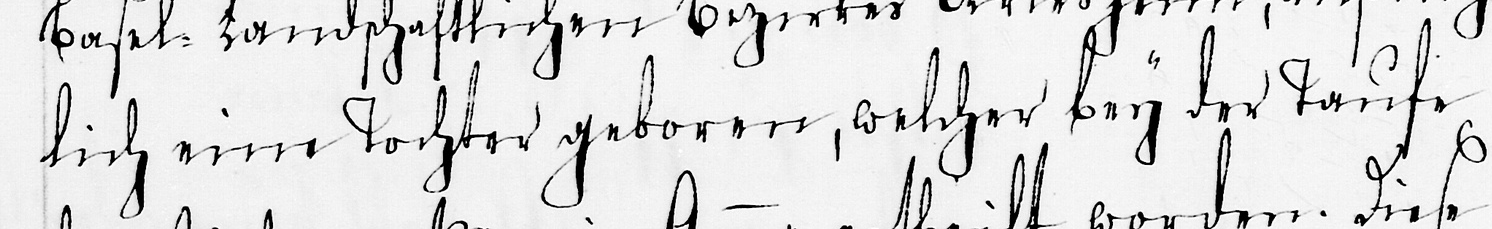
lich eine Tochter geboren, welcher bey der Taufe
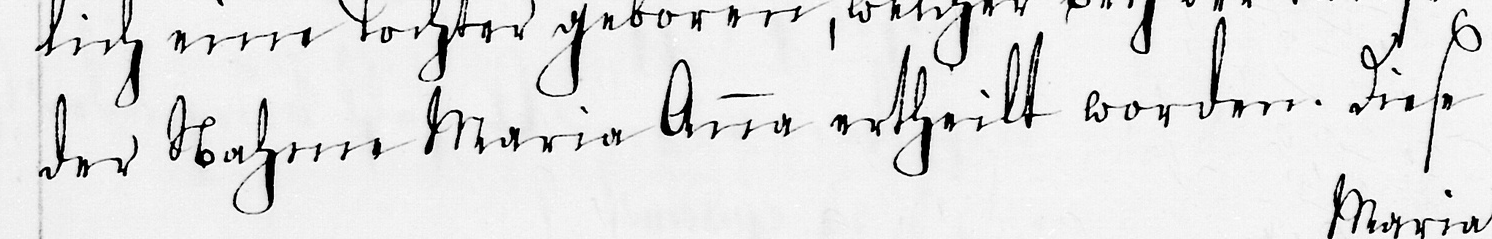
der Nahme Maria Anna ertheilt worden. Diese
